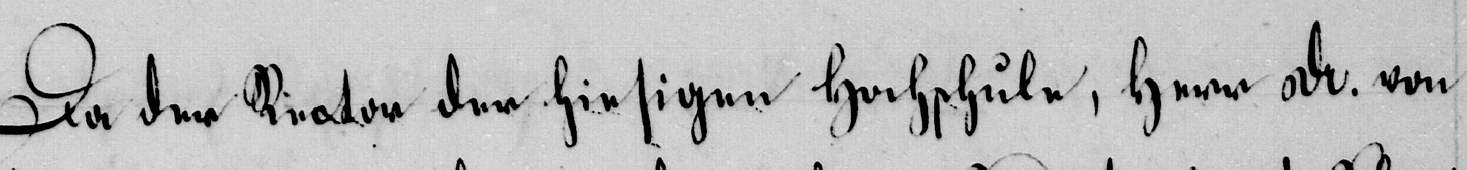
Da der Rector der hiesigen Hochschule, Herr Dr. von
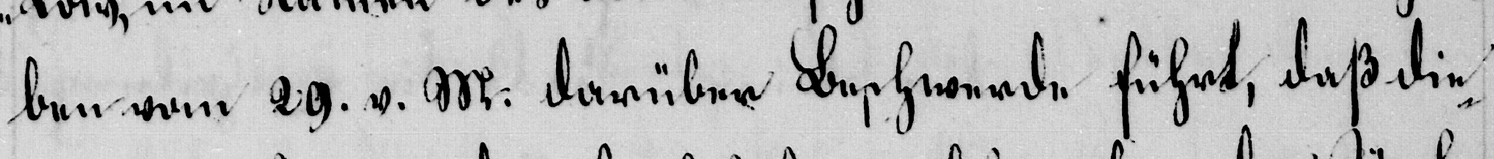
iben vom 29. v. M. darüber Beschwerde führt, daß die¬
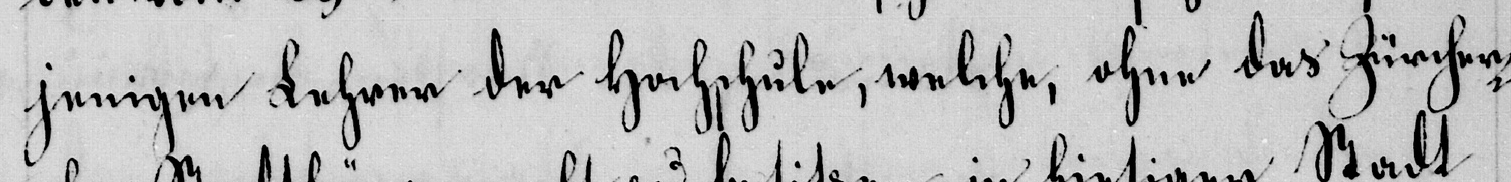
jenigen Lehrer der Hochschule, welche, ohne das Zürcher¬
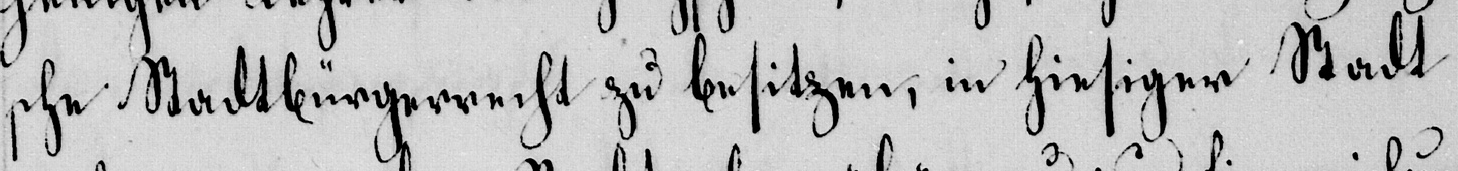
sche Stadtbürgerrecht zu besitzen, in hiesiger Stadt
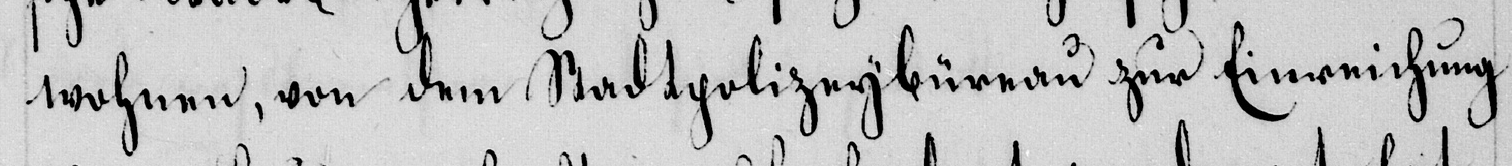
wohnen, von dem Stadtpolizeybüreau zu Einreichung
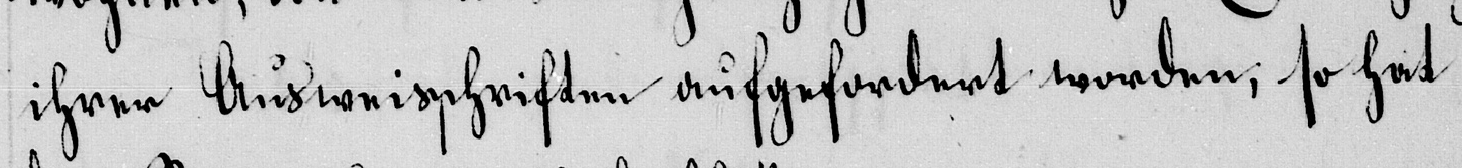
ihrer Ausweisschriften aufgefordert worden, so hat
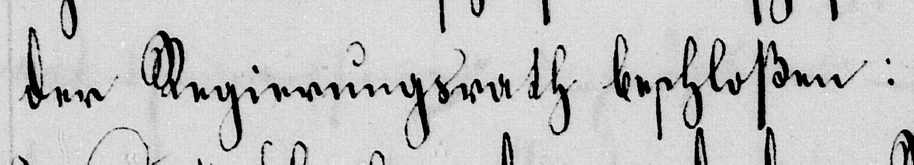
der Regierungsrath beschloßen:
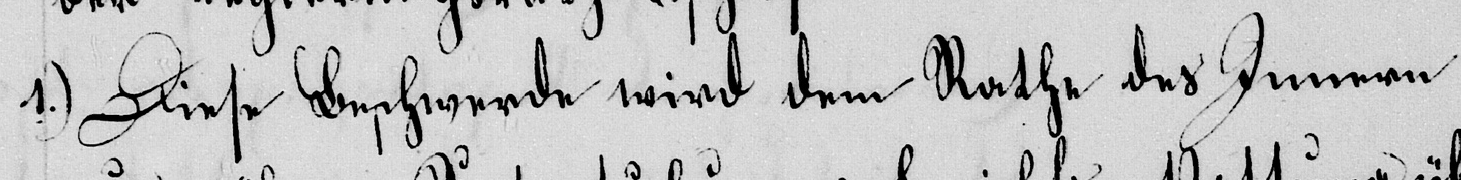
1.) Diese Beschwerde wird dem Rathe des Innern
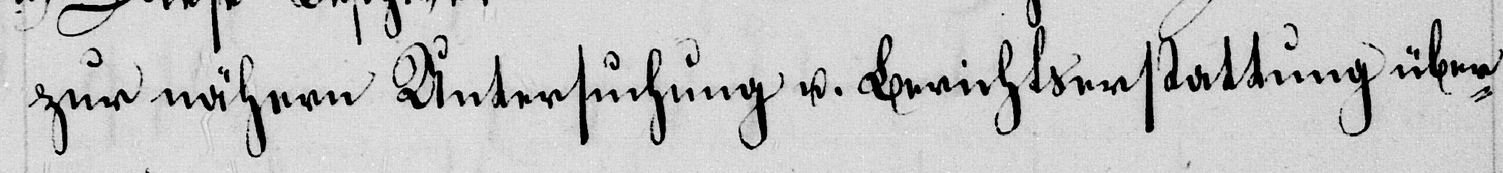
zur nähern Prüfung u. Berichtserstattung über¬
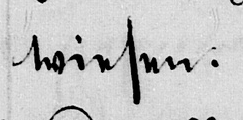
wiesen.
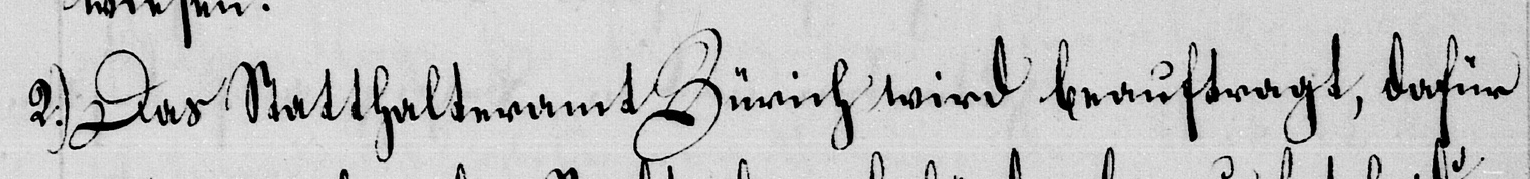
2.) Das Statthalteramt Zürich wird beauftragt, dafür
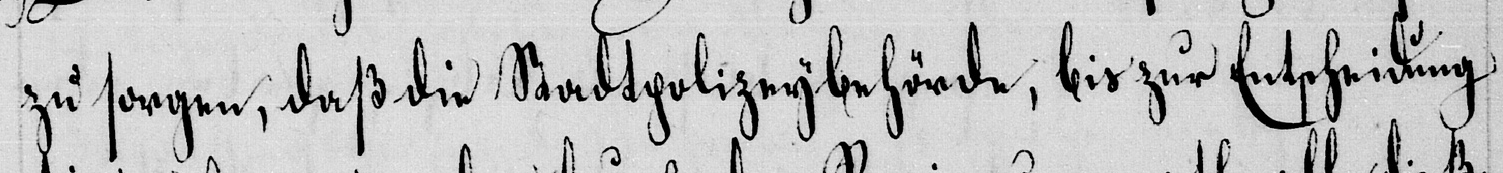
zu sorgen, daß die Stadtpolizeybehörde, bis zur Entscheidung
